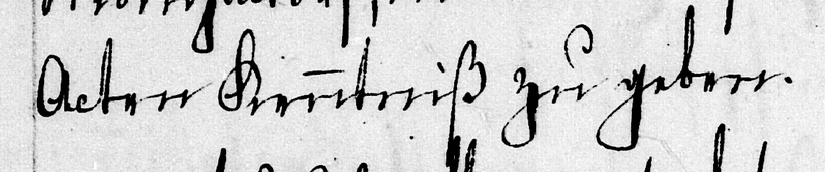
Acten Kenntniß zu geben.
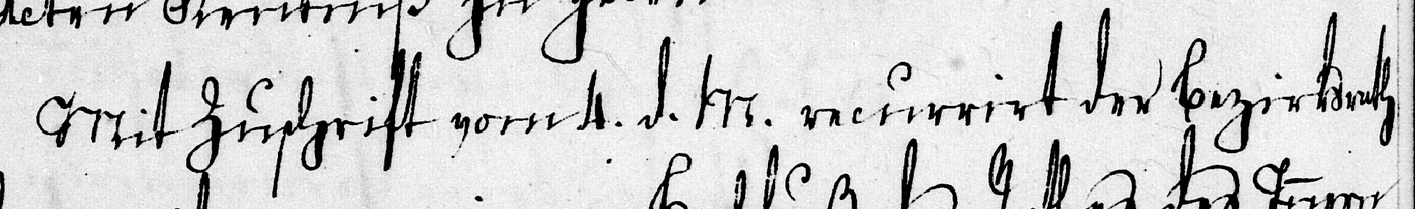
Mit Zuschrift vom 4. d. M. recurrirt der Bezirksrath
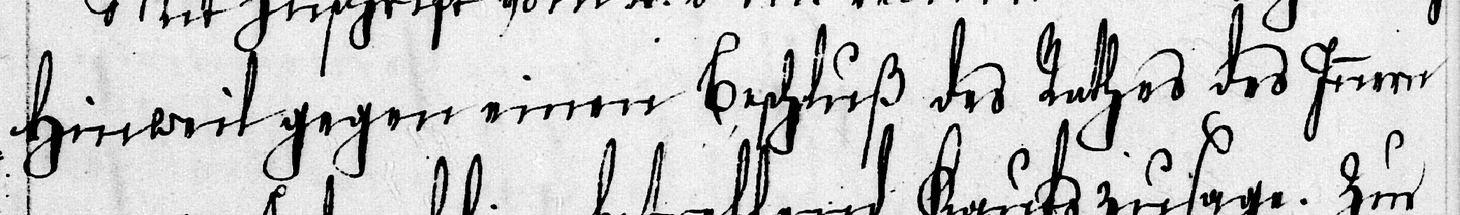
Hinweil gegen einen Beschluß des Rathes des Innern
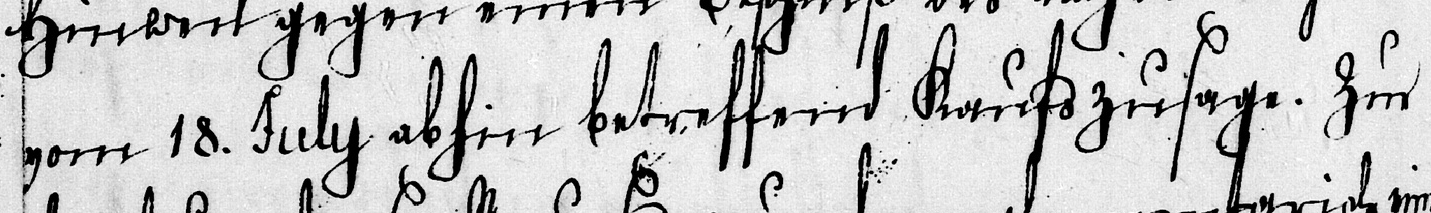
vom 18. July abhin betreffend Kaufszusage. Zur
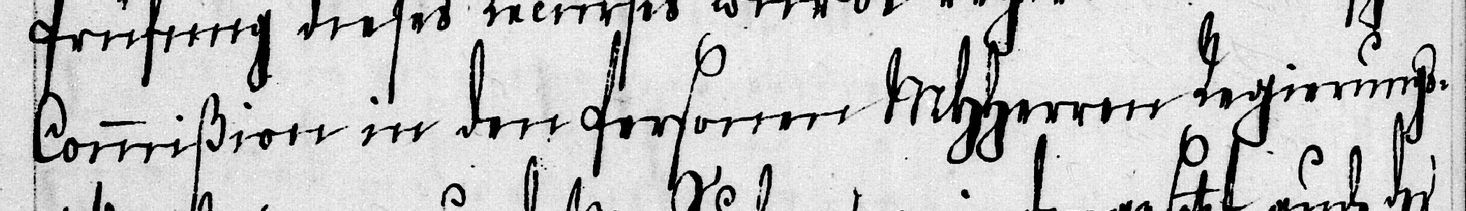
Commißion in den Personen MHHerren Regierung¬
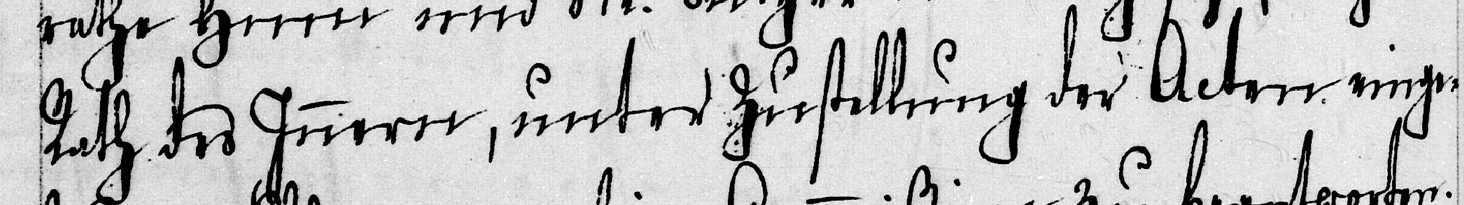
Rath des Innern, unter Zustellung der Acten eing¬
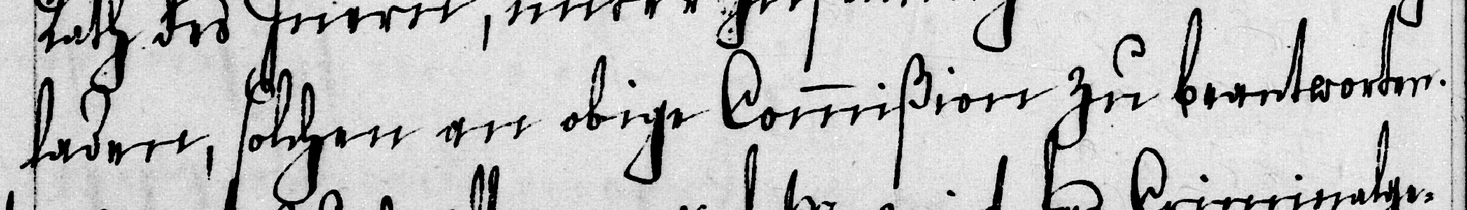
eladen, solchen an obige Commißion zu beantworten.
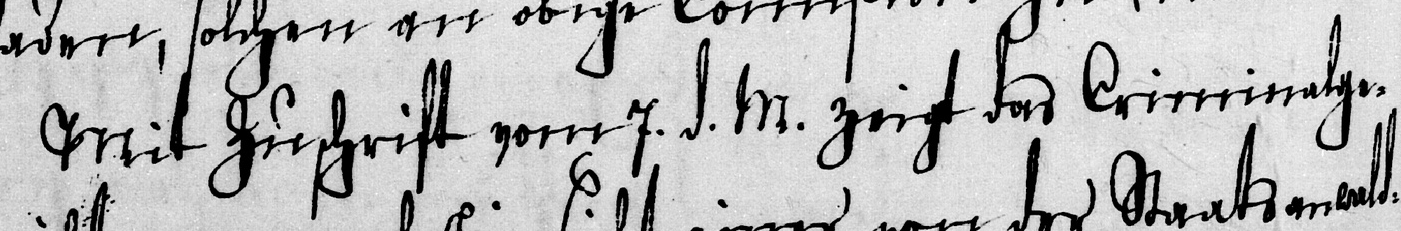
Mit Zuschrift vom 7. d. M. zeigt das Criminalge¬
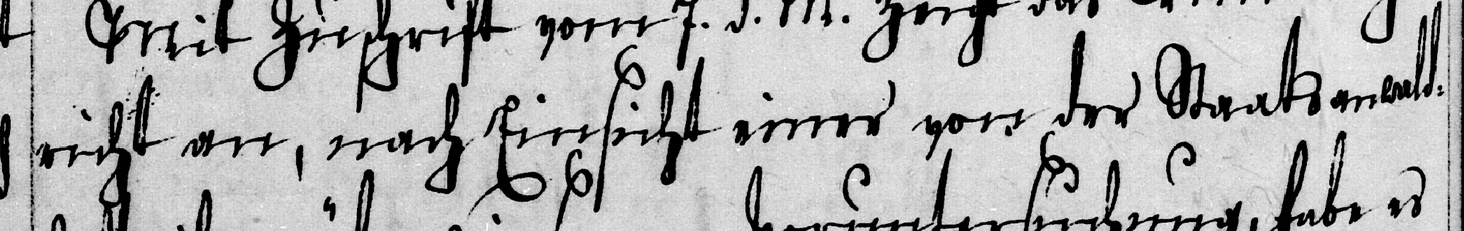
richt an, nach Einsicht einer von der Staatsanwal¬
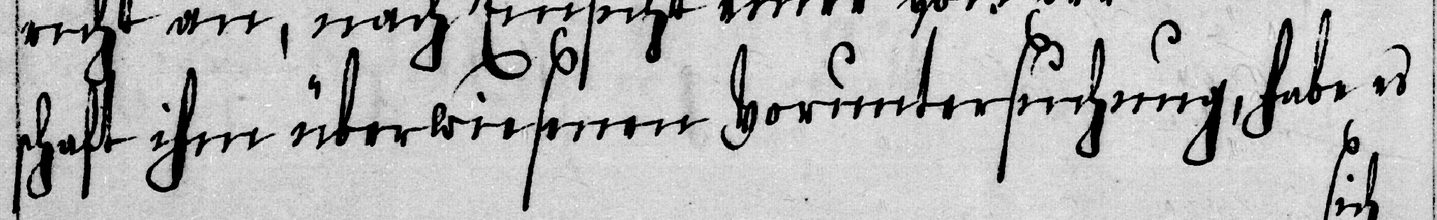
haft ihm überwiesenen Voruntersuchung, habe es
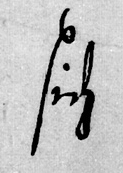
dsc¬
